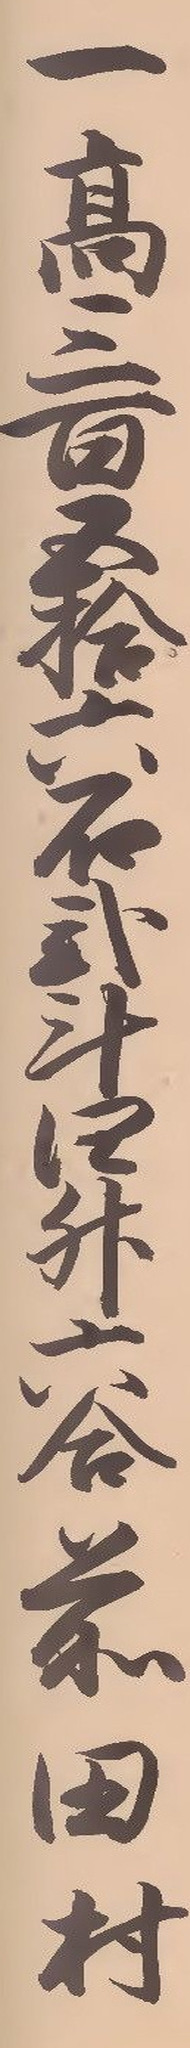一高三百五拾六石弐斗四升六合前田村
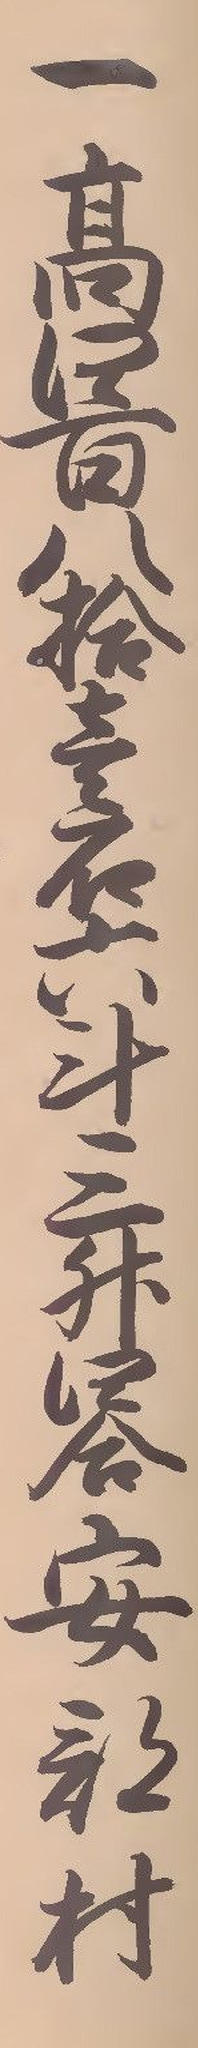一高四百八拾壱石六斗三升四合安部村
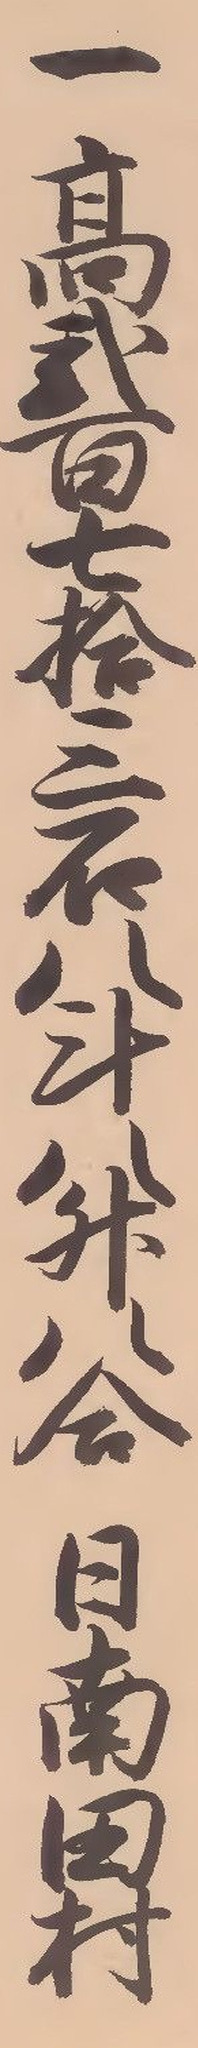一高弐百七拾三石八斗八升八合日南田村
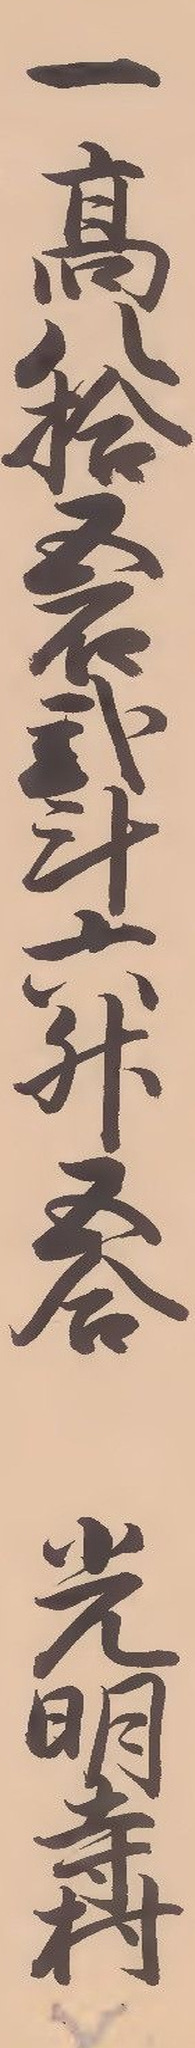一高八拾五石弐斗六升五合光明寺村
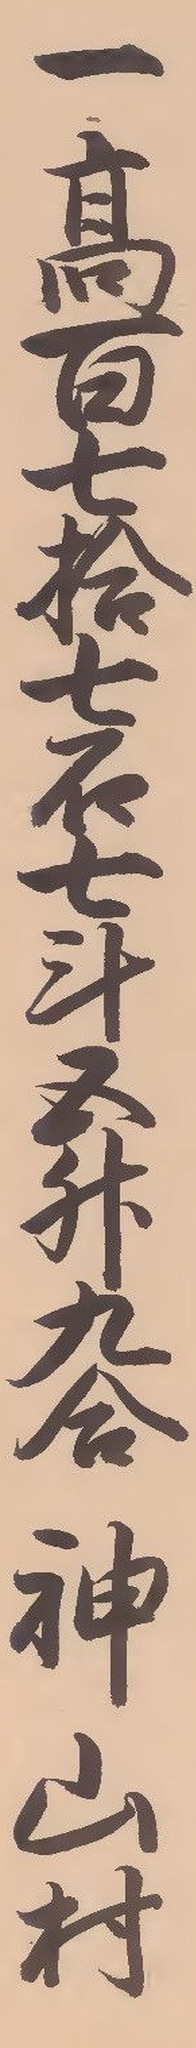一高百七拾七石七斗五升九合神山村

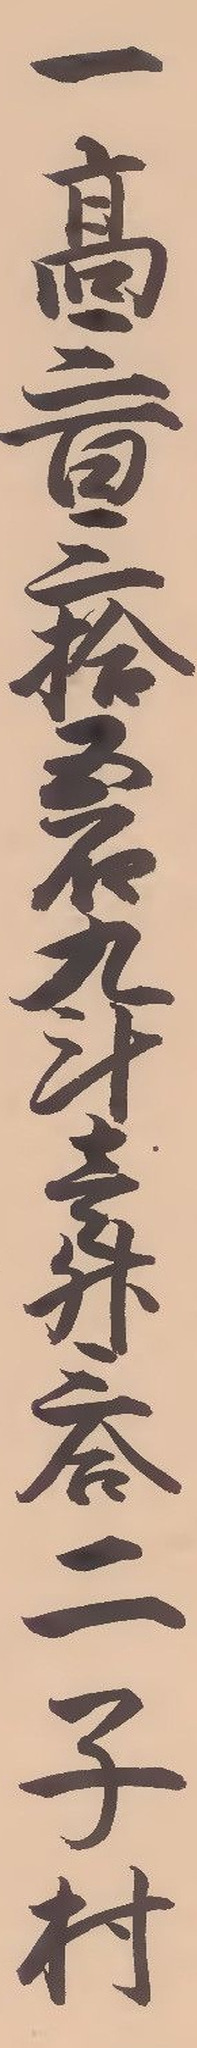一高三百三拾五石九斗壱升三合二子村
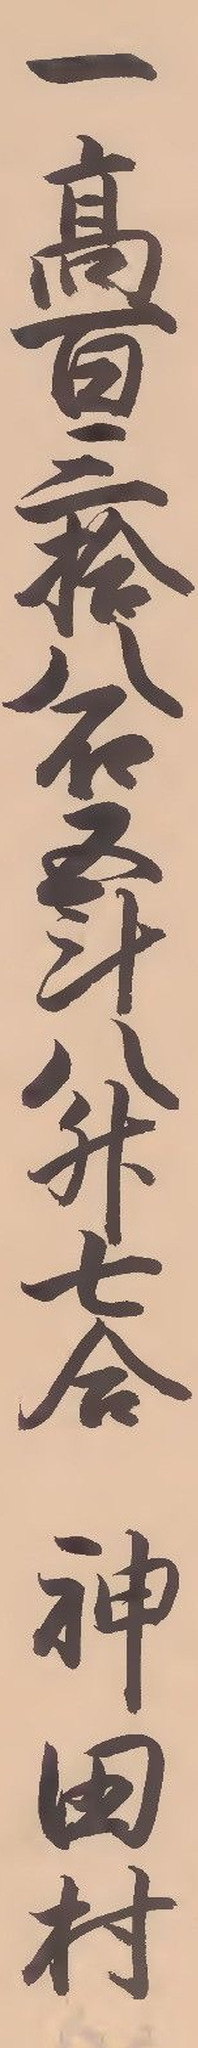一高百三拾八石五斗八升七合神田村
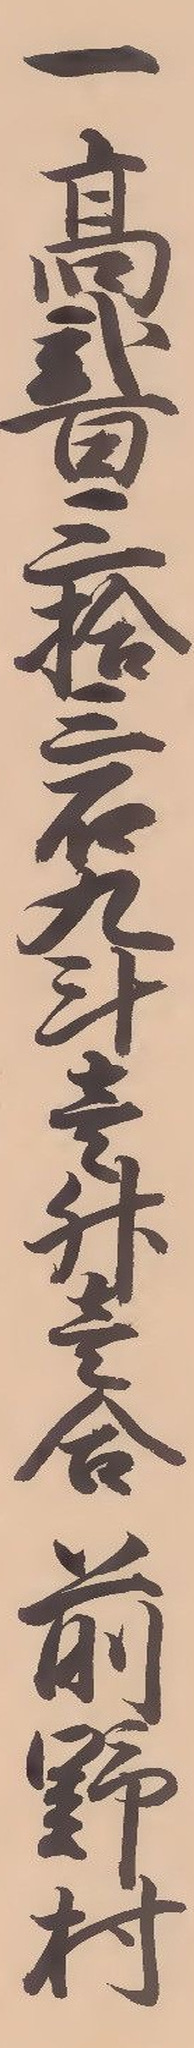一高弐百三拾三石九斗壱升壱合前野村
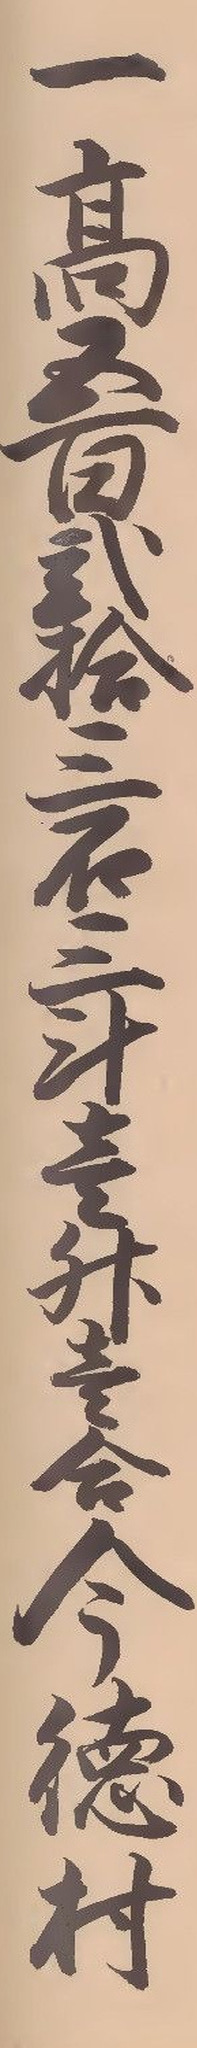一高五百弐拾三石三斗壱升壱合今徳村
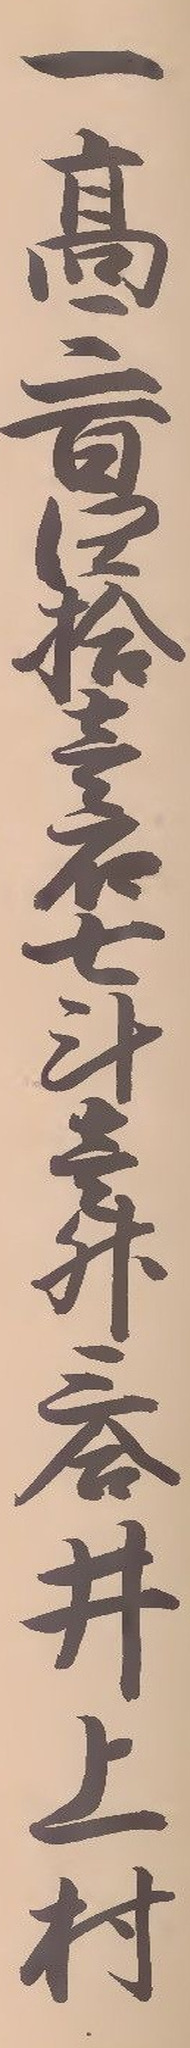一高三百四拾壱石七斗壱升三合井上村
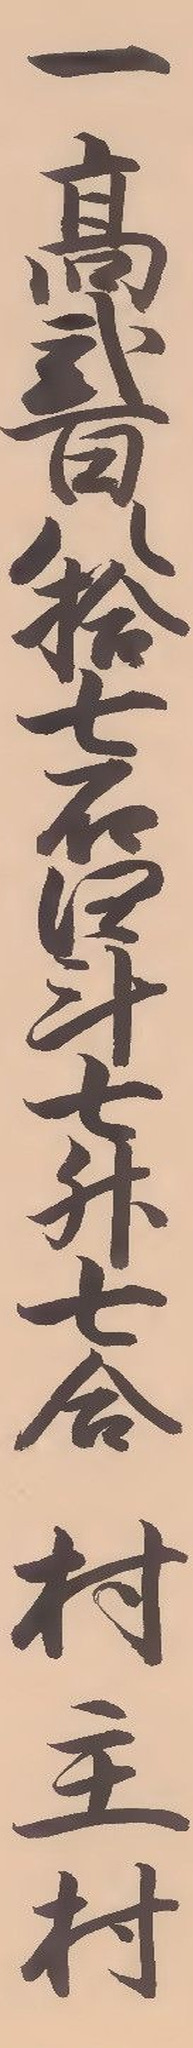一高弐百八拾七石四斗七升七合村主村
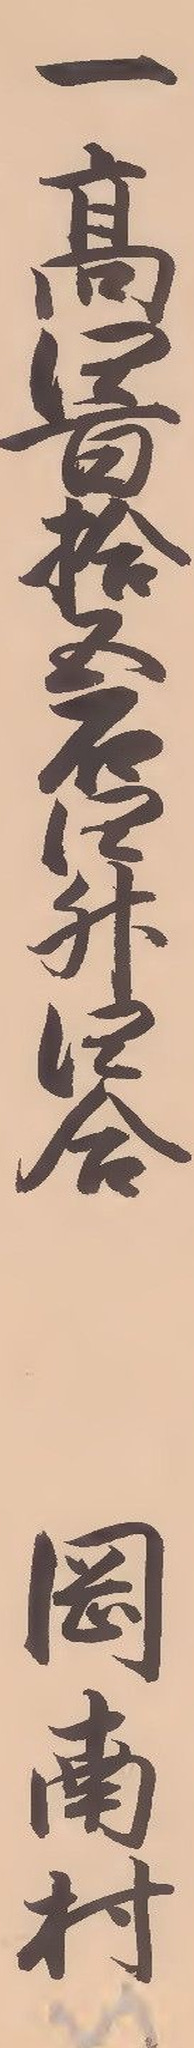一高四百拾五石四升四合岡南村
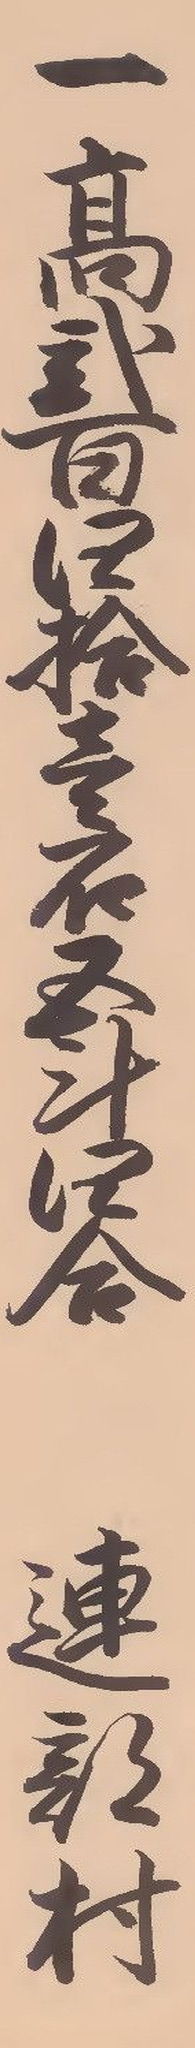一高弐百四拾壱石五斗四合連部村

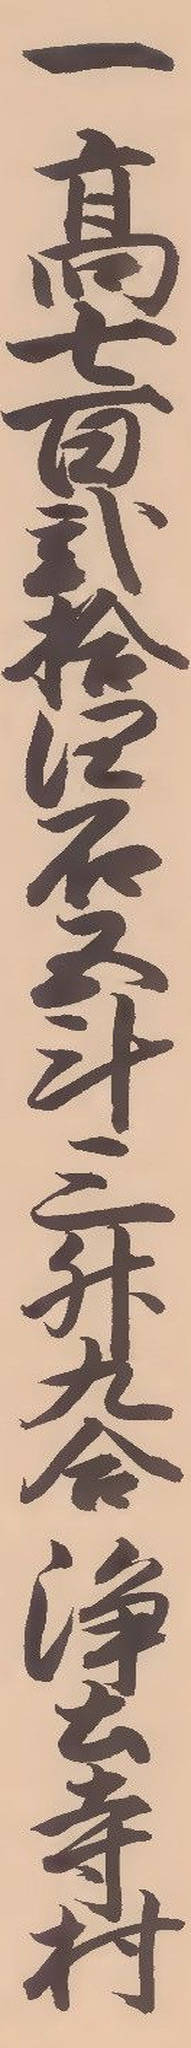一高七百弐拾四石五斗三升九合浄土寺村
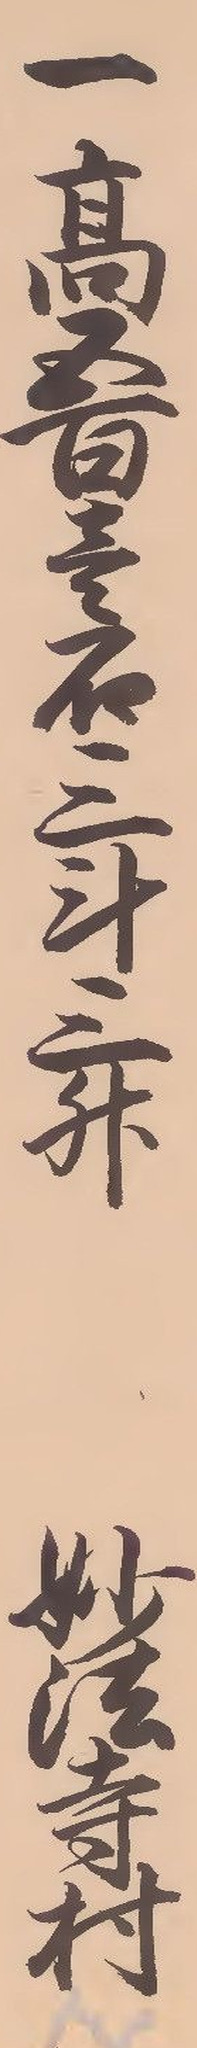一高五百壱石三斗三升妙法寺村
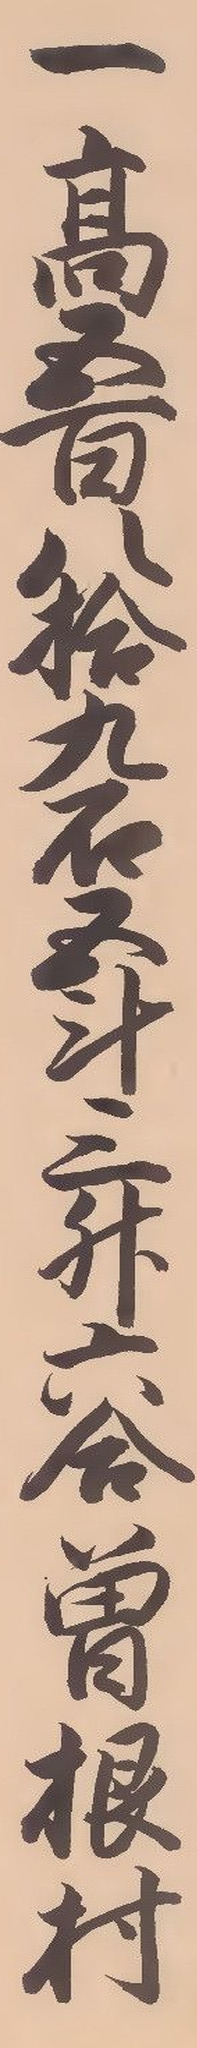一高五百八拾九石五斗三升六合曽根村
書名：伊勢国郷帳
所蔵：国立公文書館 National Archives of Japan
